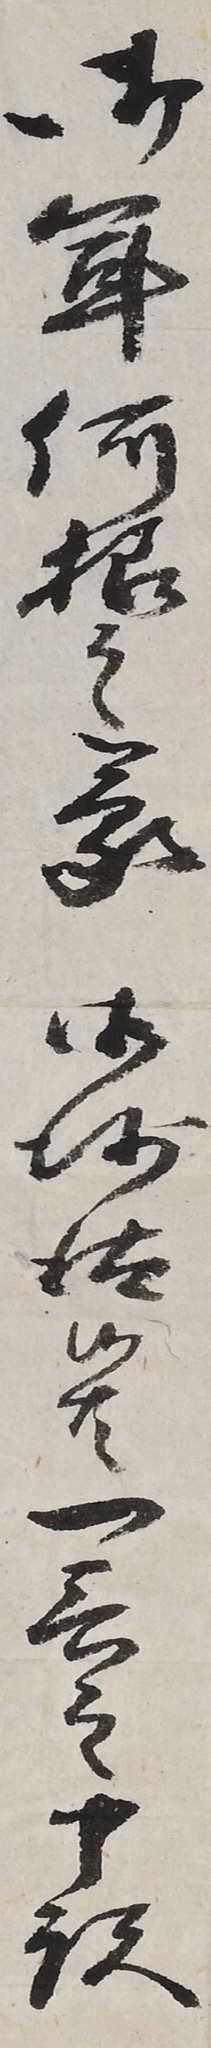御聞何様之蒙御沙汰候共一言之申訳
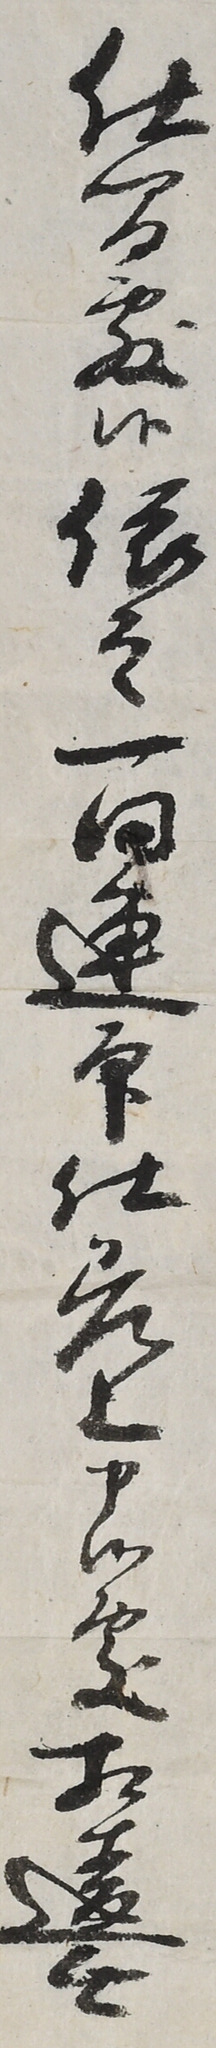仕間敷候依之一同連印仕差上申候処相違無
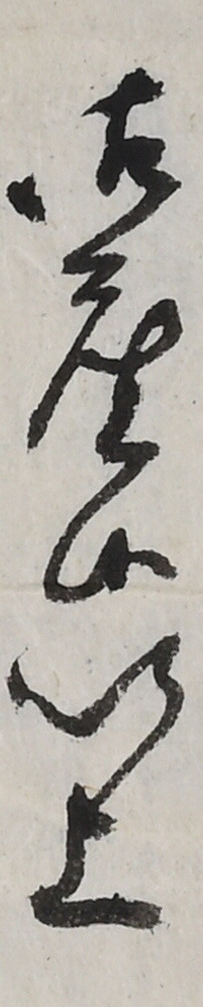御座候以上
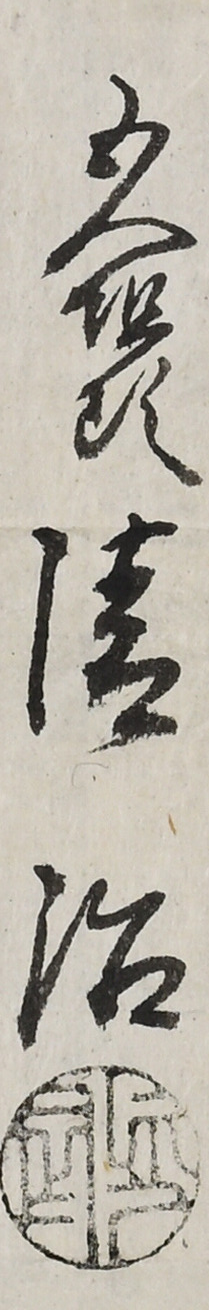五人組頭紋治㊞
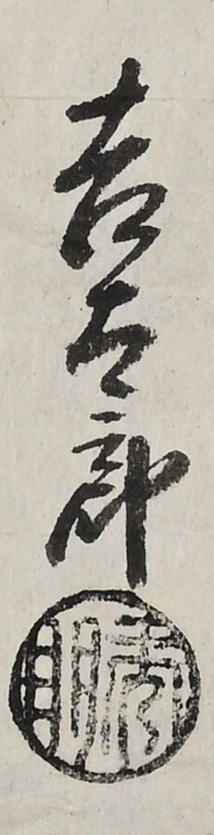吉太郎㊞
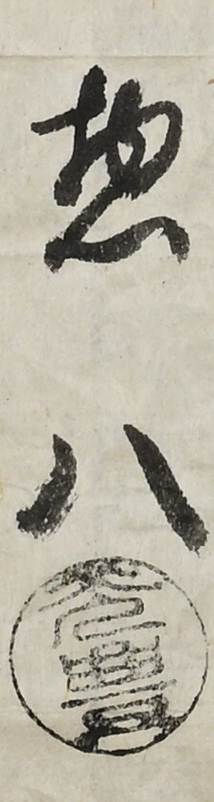惣八㊞
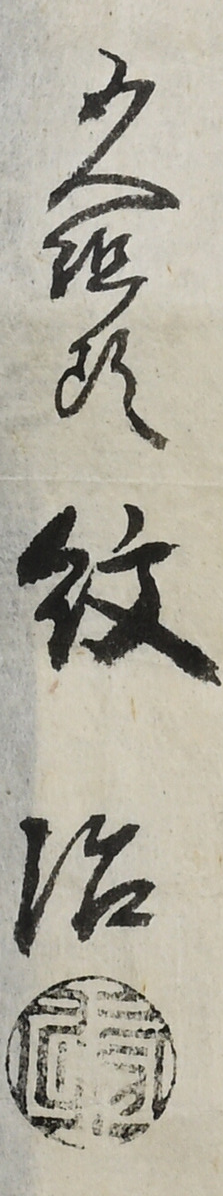五人組頭紋治㊞

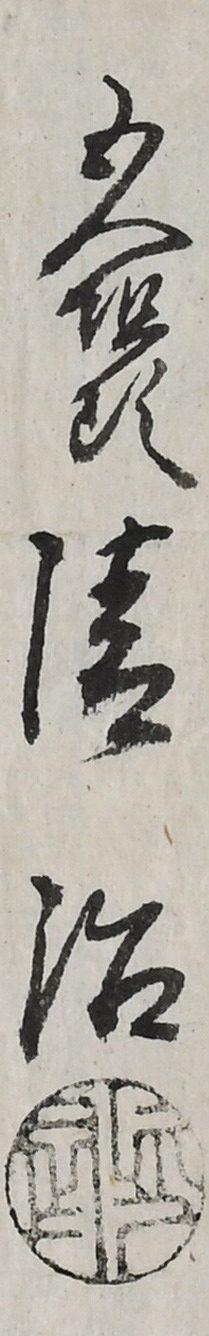五人組頭勇治㊞
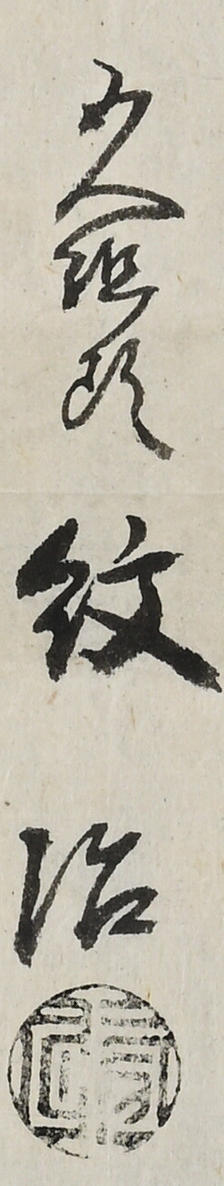五人組頭勇治㊞
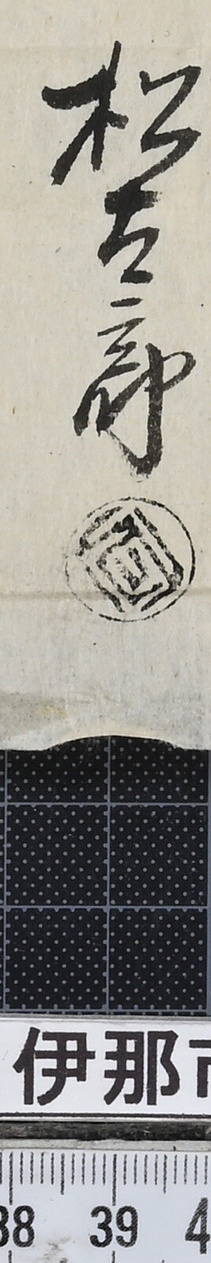松太郎㊞
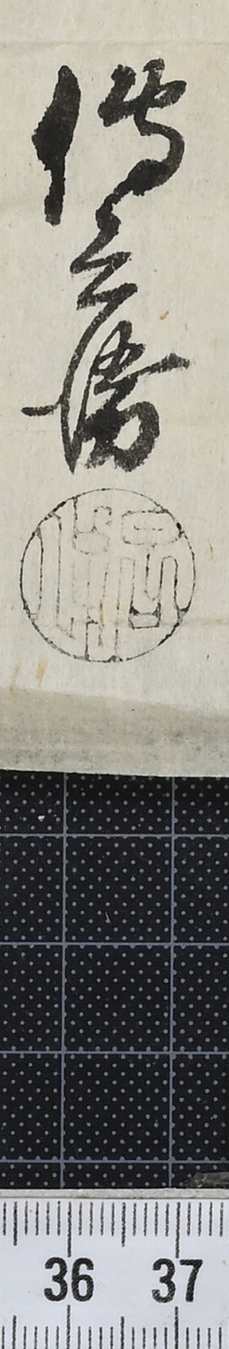伝兵衛㊞
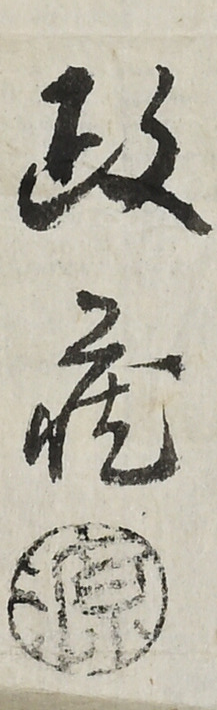政蔵㊞
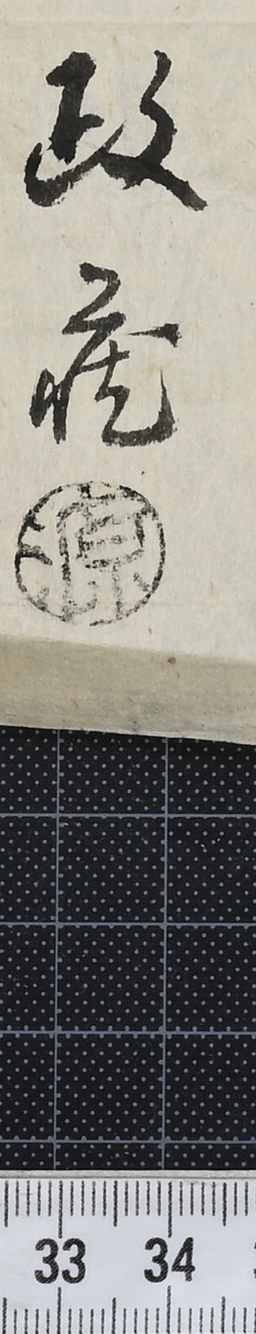政蔵㊞
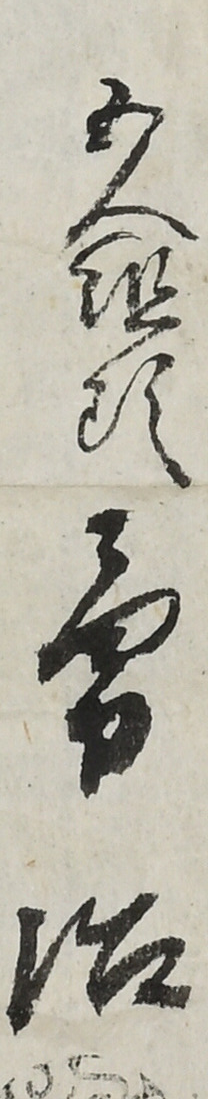五人組頭勇治㊞

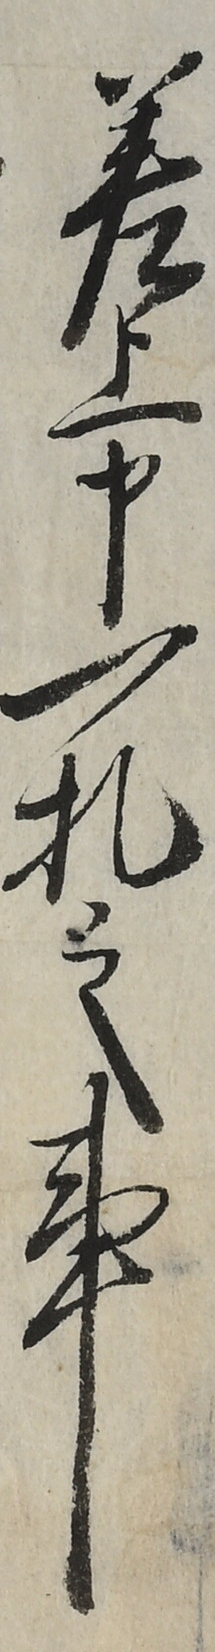差上申一札之事
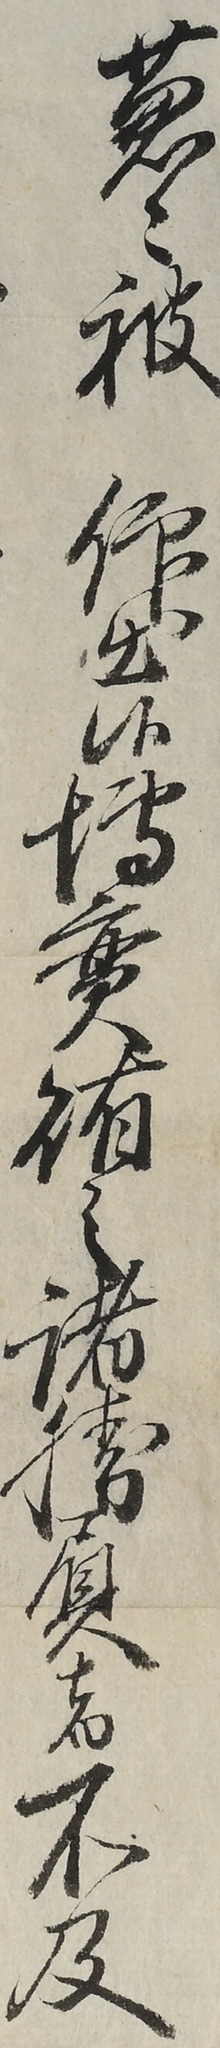兼々被仰出候博奕賭之諸勝負者不及
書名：差上申一札之事
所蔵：伊那市立高遠町図書館・合同会社AMANE
